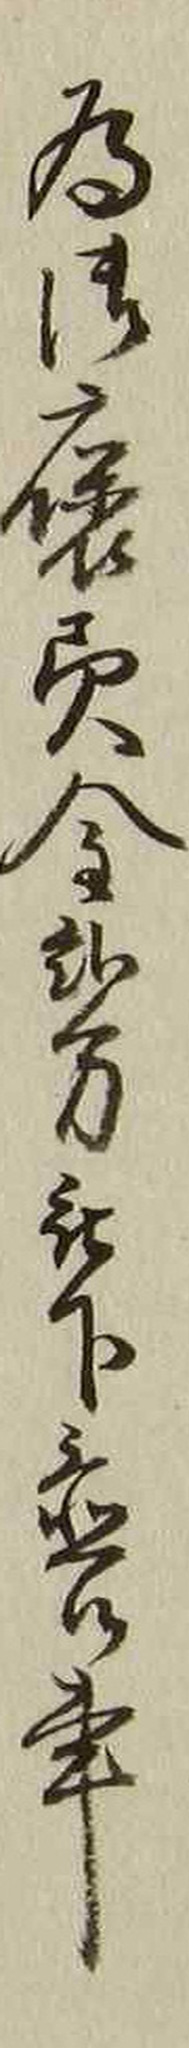為御褒美金弐分被下置候事
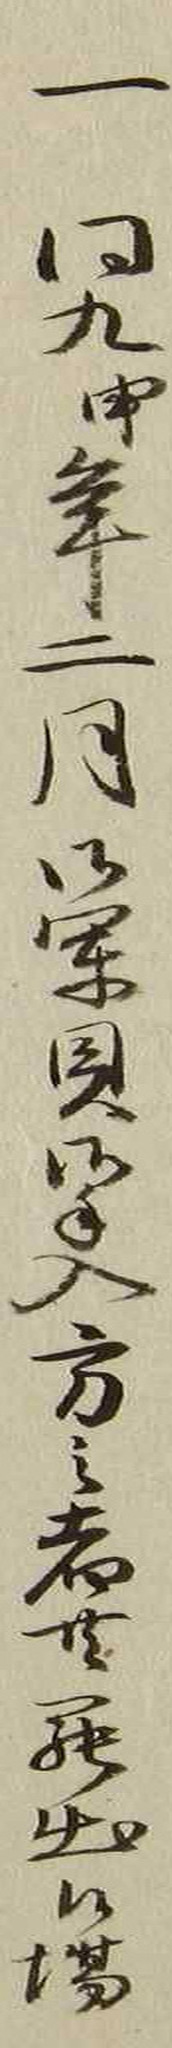一同九申年二月御軍貝御手入方之者共罷出候場
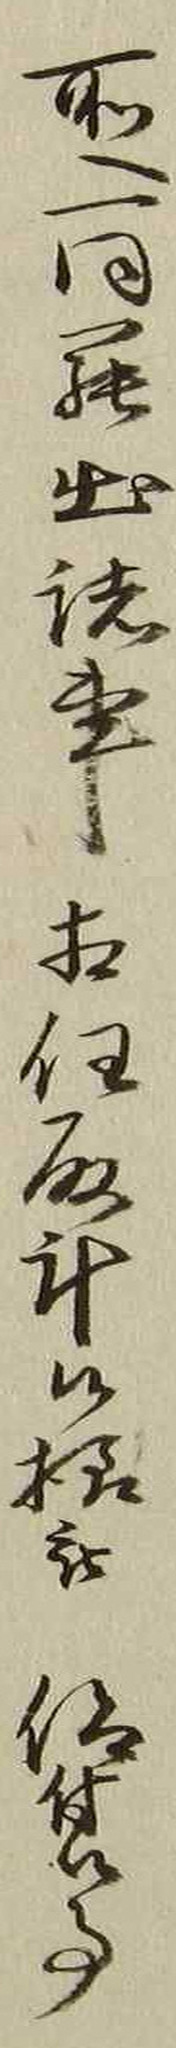所へ一同罷出諸事相任取計候様被仰付候事
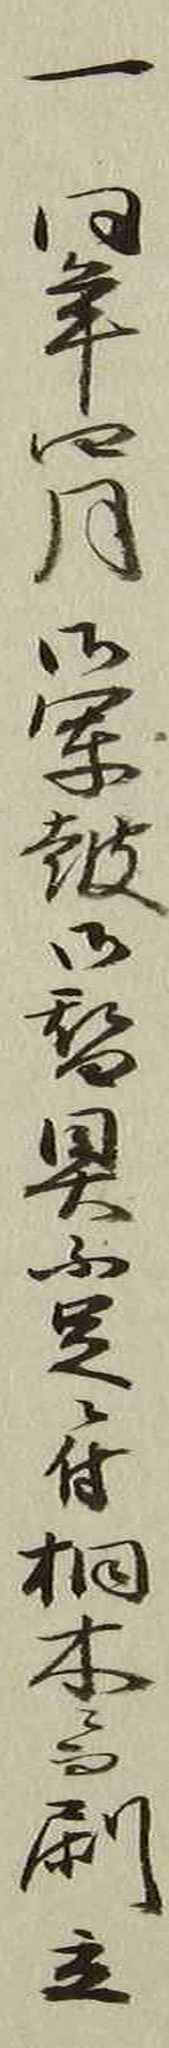一同年四月御軍鼓御替具不足ニ付桐木ニ而刷立
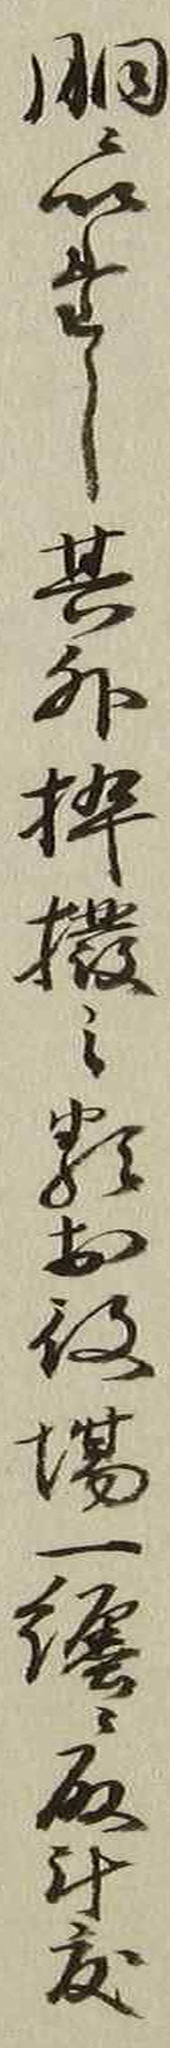胴ニいたし其外枠撥之類於役場一纏ニ取計度
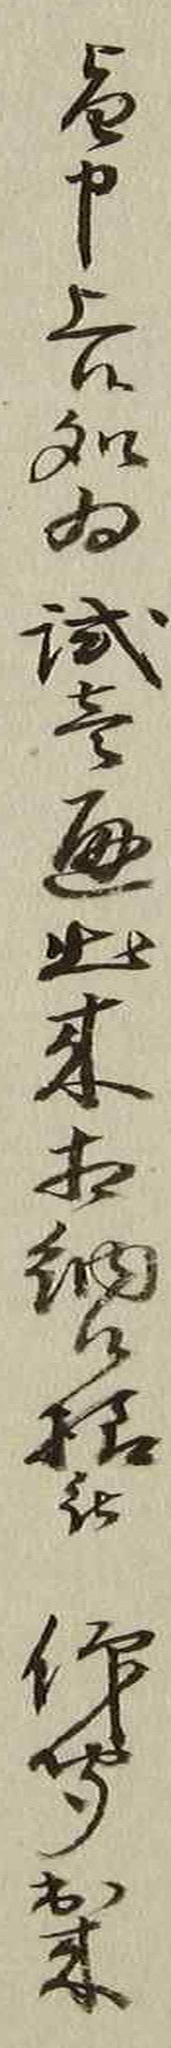旨申上候処為試壱通出来相納候様被仰聞出来
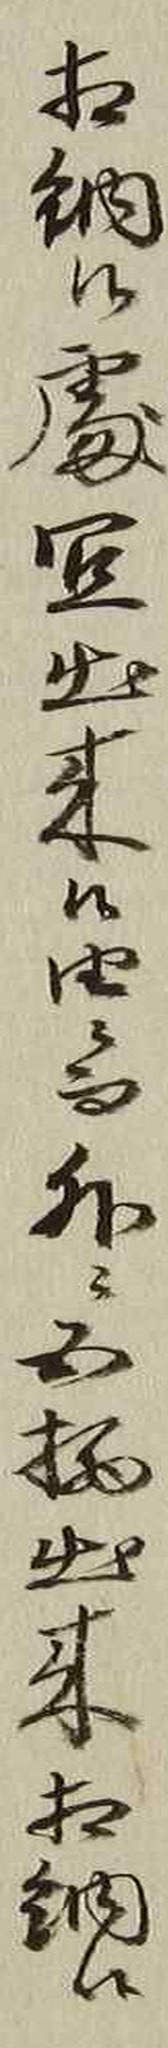相納候処宜出来候由ニ而外ニ五柄出来相納候
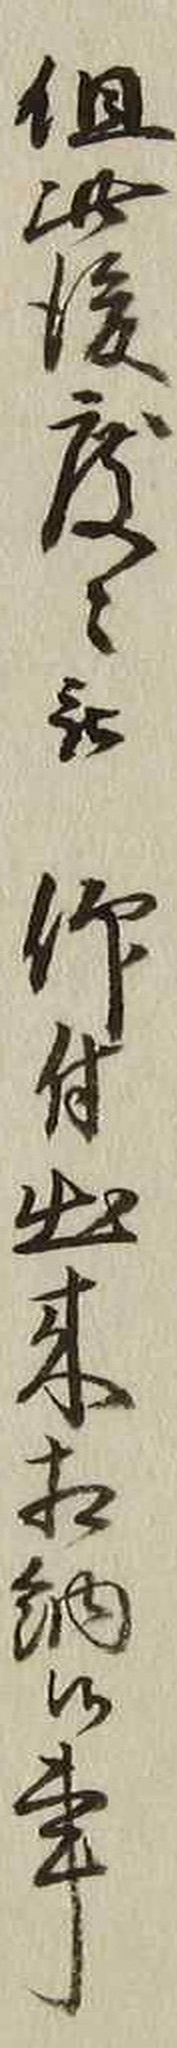但此後度々被仰付出来相納候事
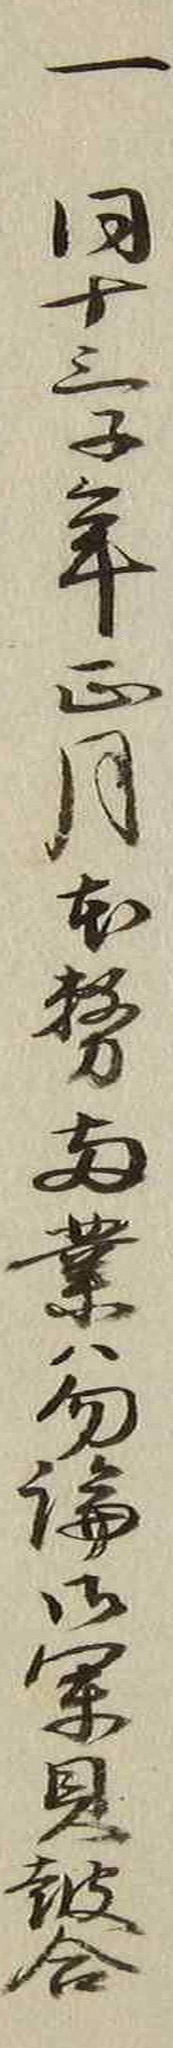一同十三子年正月本務両業ハ勿論御軍貝鼓合
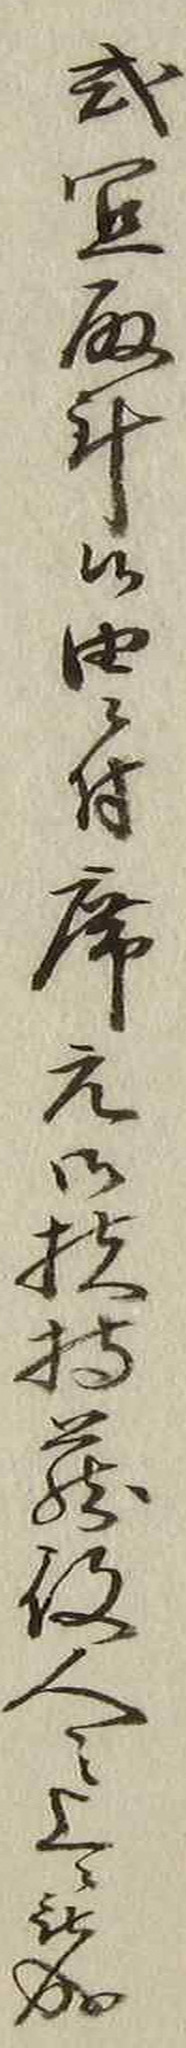式宜取計候由ニ付席元御扶持蔵役人之上ニ被成
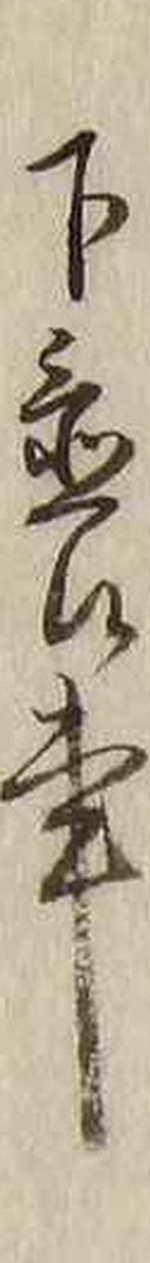下置候事
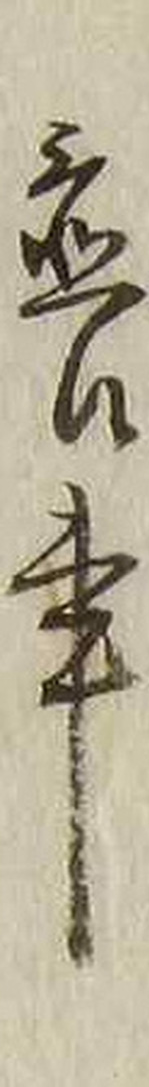置候事
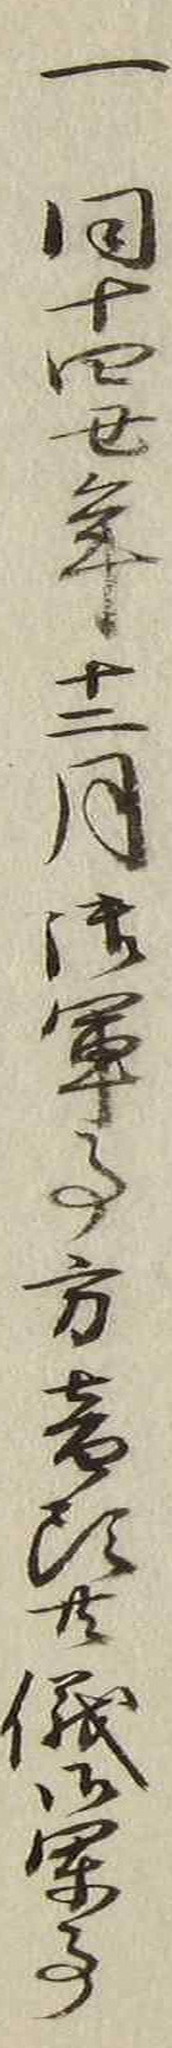一同十四丑年十二月御軍事方音頭共儀御軍事
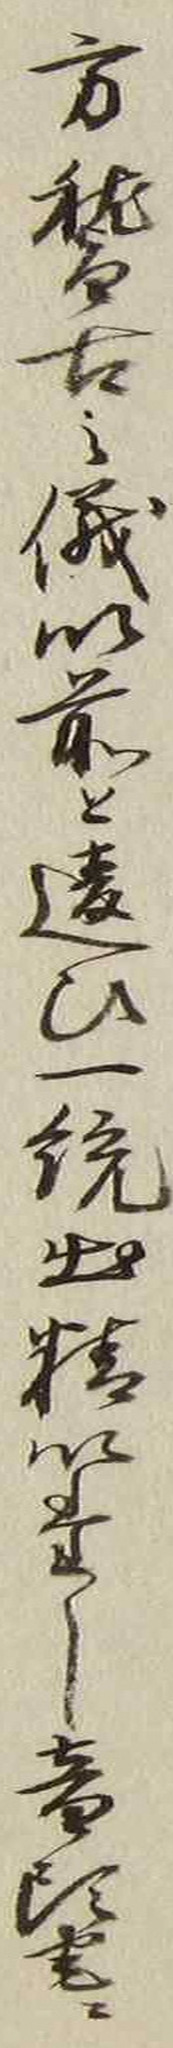方稽古之儀以前と違ひ一統出精いたし音頭宅ニ
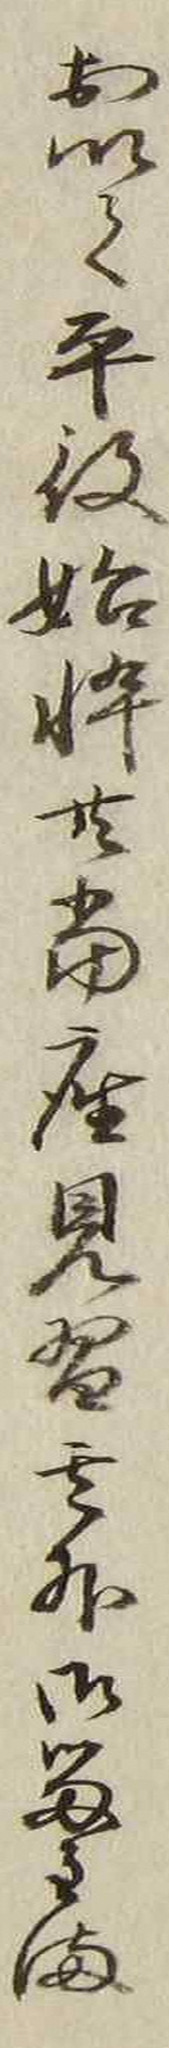おいて平役始忰共当座見習其外御留主備
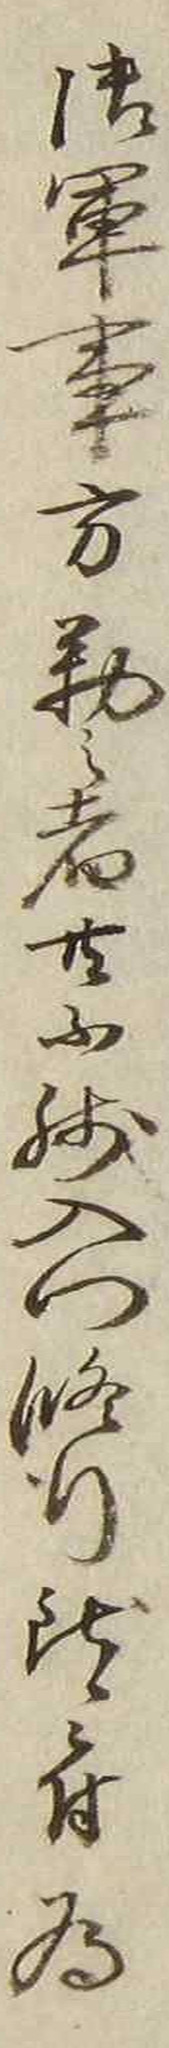御軍事方勤之者共不残入門修行致候ニ付為
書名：諸士系譜　巻之102　か之部10
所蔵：会津若松市立会津図書館
